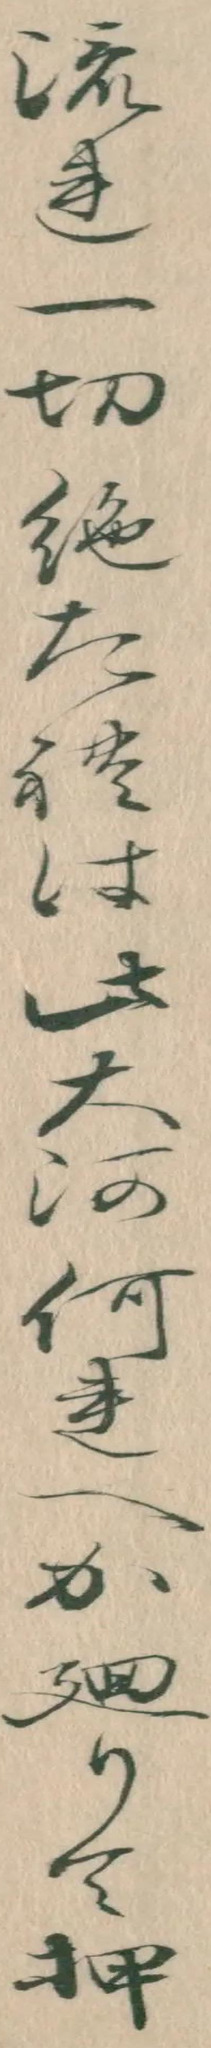流れ一切絶たれは此大河何れへか廻りて押
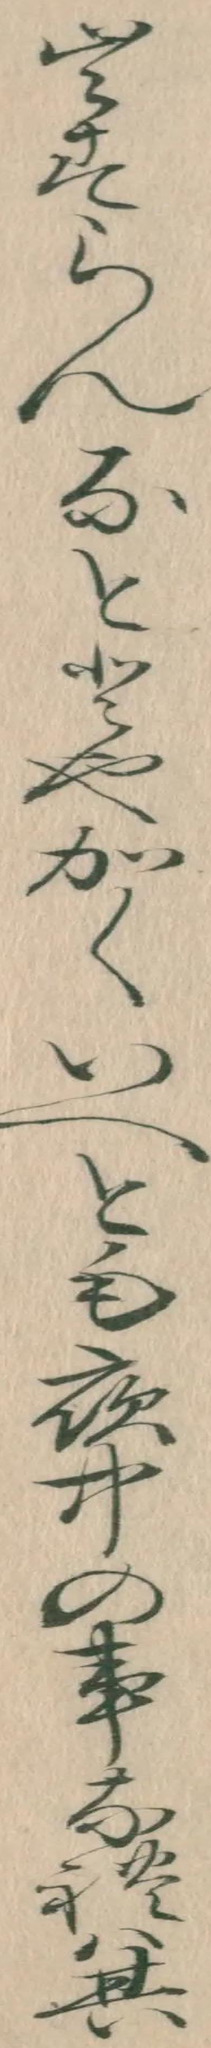出すらんなととやかくいへとも夜中の事なれは其
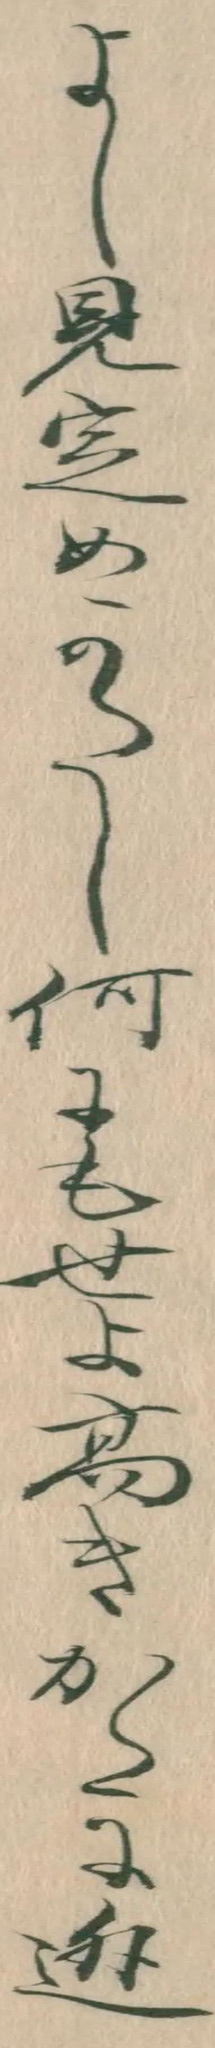よし見定めかたし何にもせよ高きかたに逃
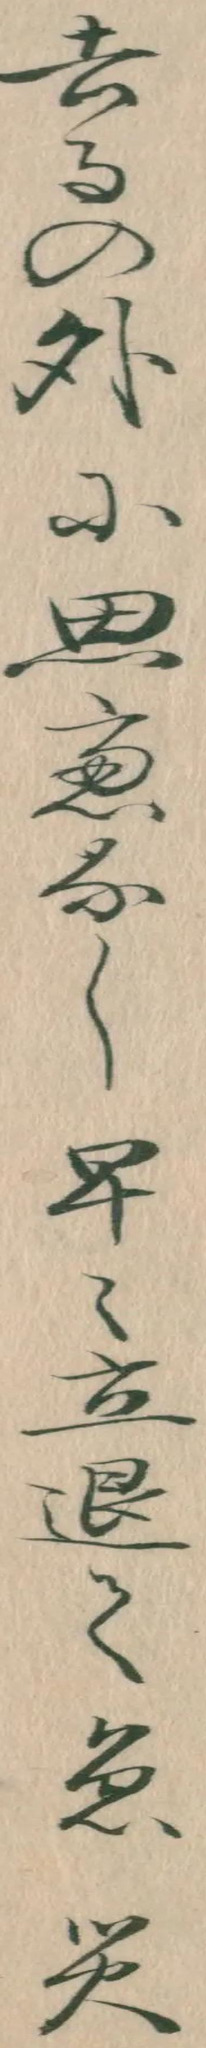去るの外に思慮なし早〻立退て急災
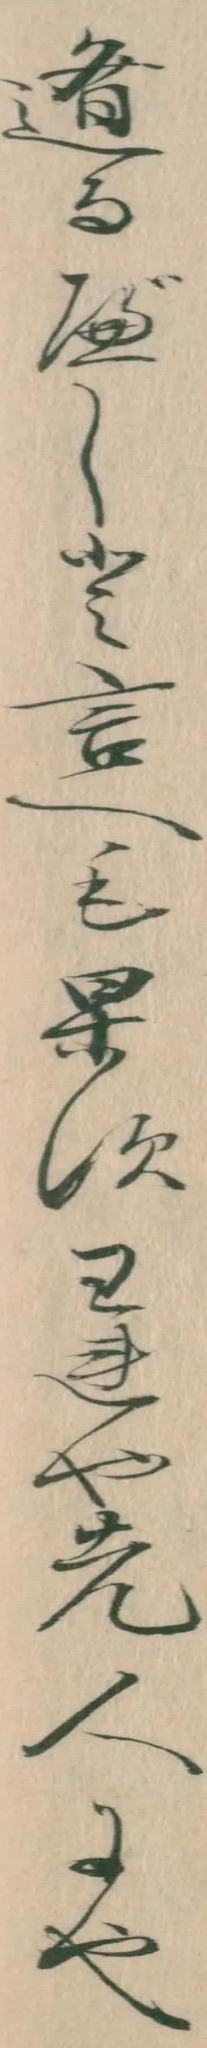遁るべしと言へも果すわれや先人にや
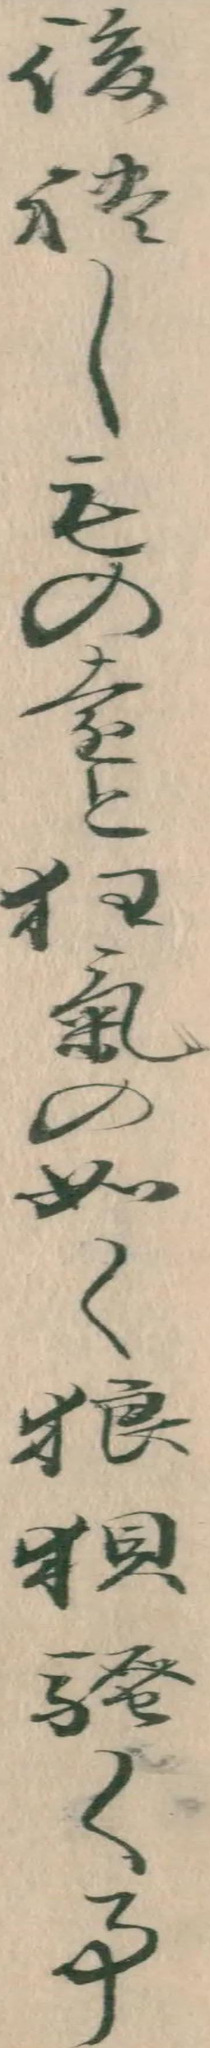後れしものをと狂気の如く狼狽騒く事
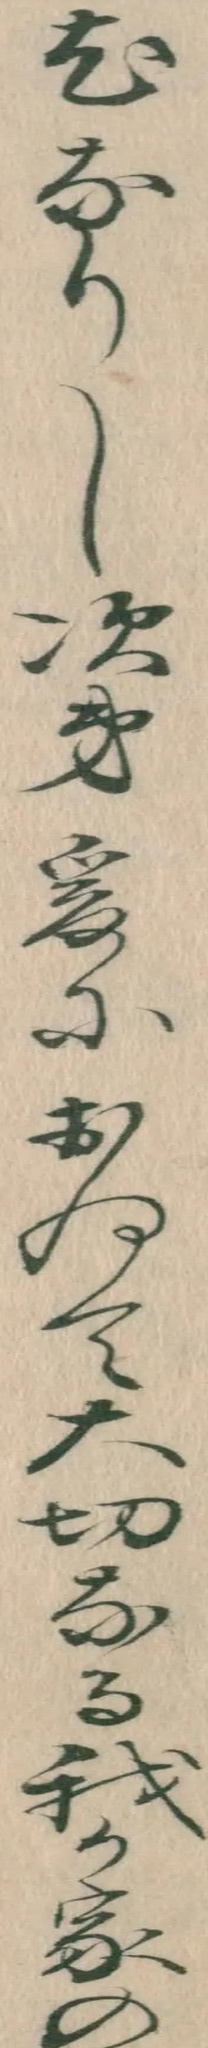尤なりし次第爰におゐて大切なる我か家の
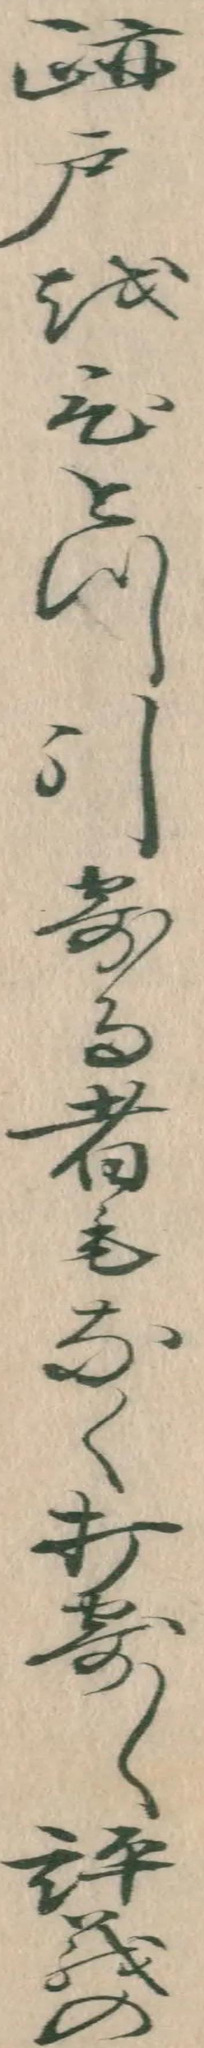跡戸をひとつ引寄る者もなく打寄〳〵評義の
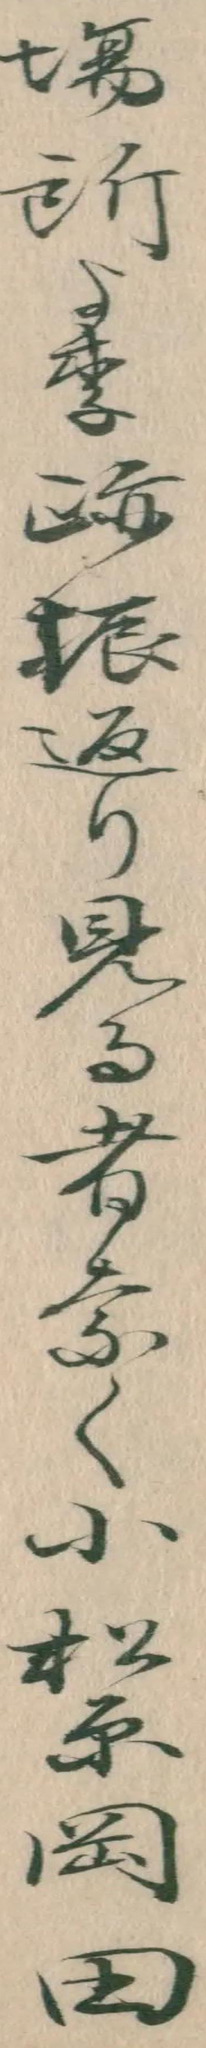場所より跡振返り見る者なく小松原岡田
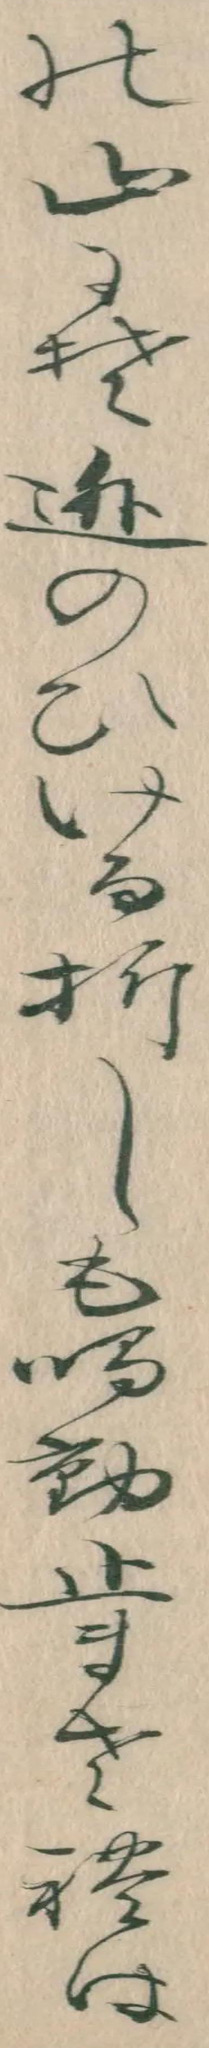の山にそ逃のひける折しも鳴動止まされは
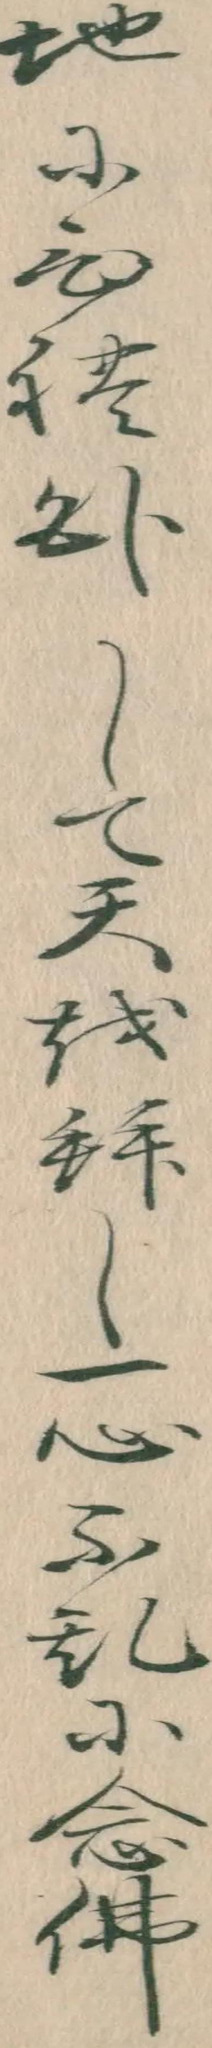地にひれ臥して天を拝し一心不乱に念仏
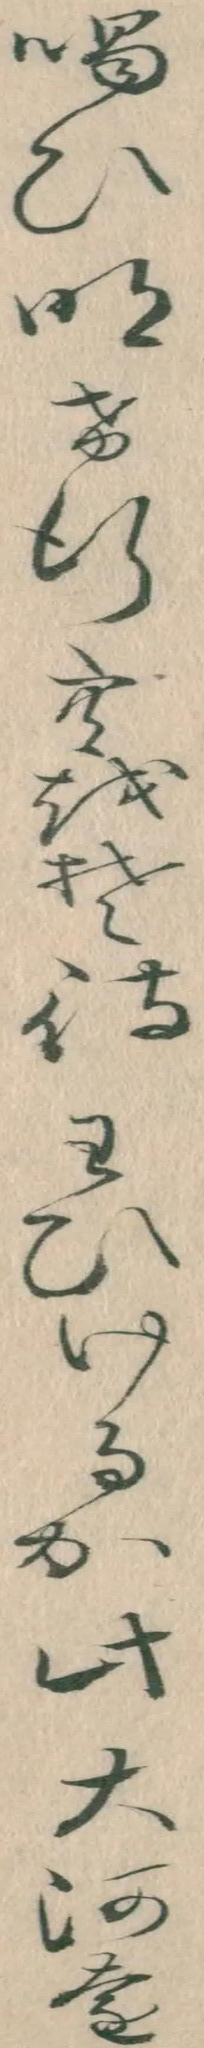唱ひ明け行空をそ待わひけるか此大河を
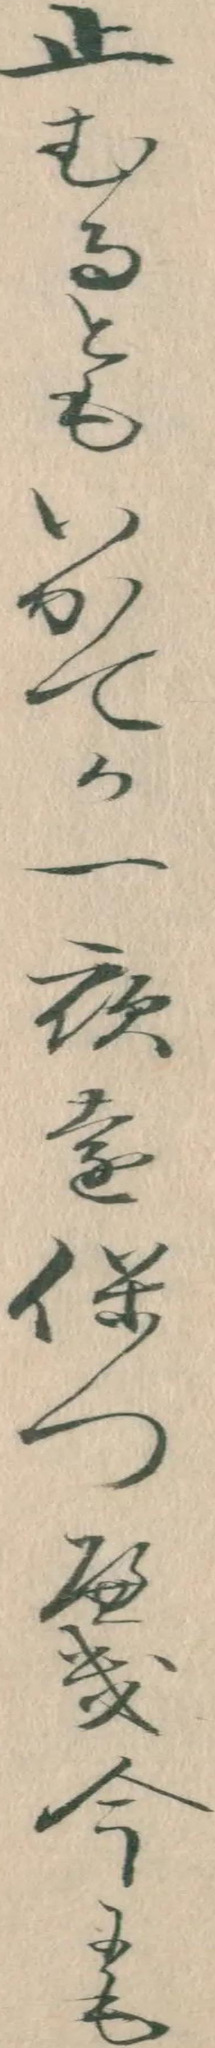止むるともいかてか一夜を保つへき今にも
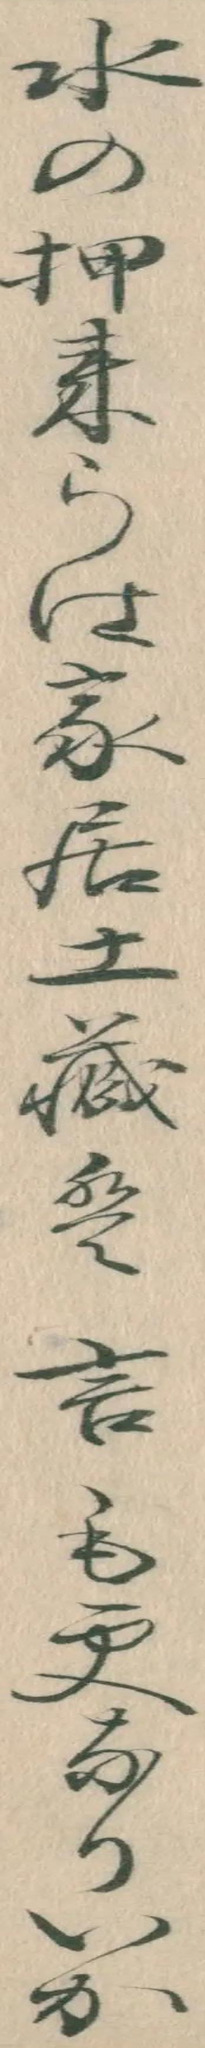水の押来らは家居土蔵は言も更なりいか
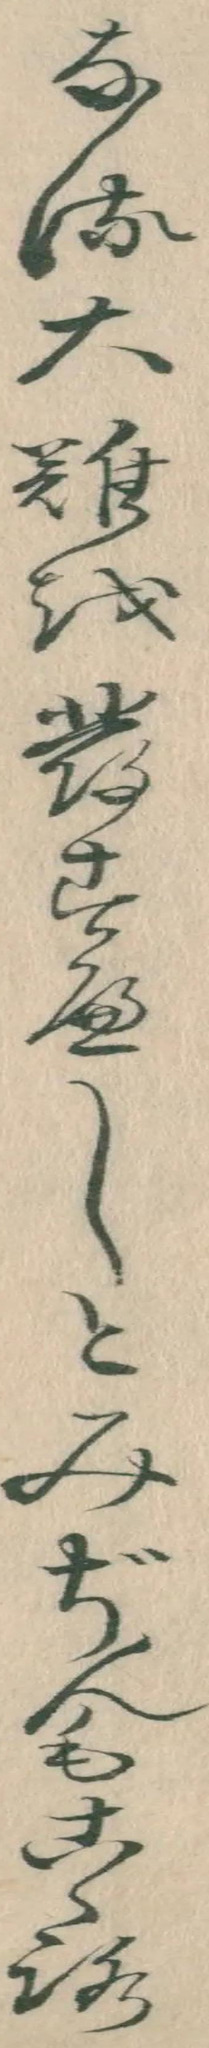なる大難を発すへしとみぢんもこゝろ

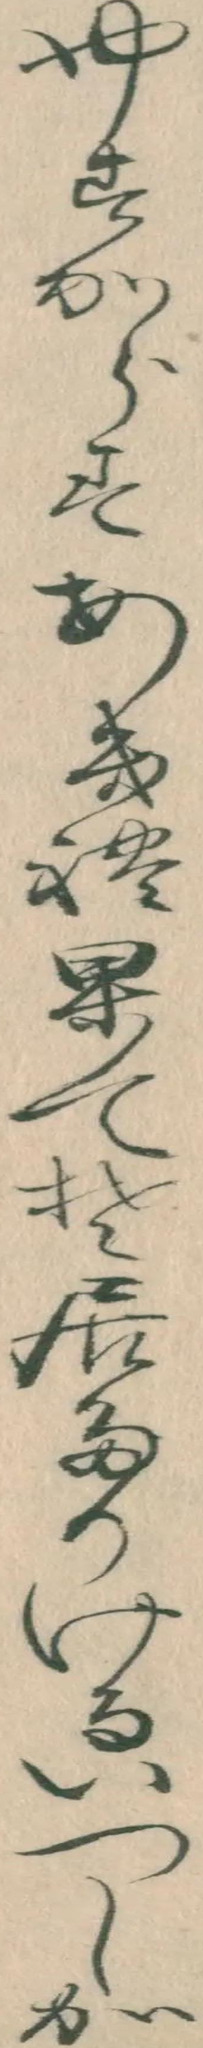やすからすあきれ果てそ居たりけるいつしか
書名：俗語之種. [6]
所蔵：国立国会図書館 National Diet Library, JAPAN
